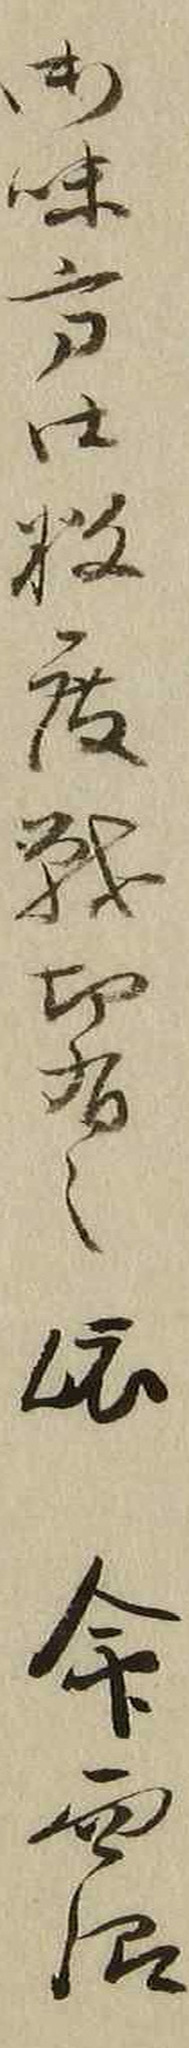御味方仕数度戦功有之処命西郷
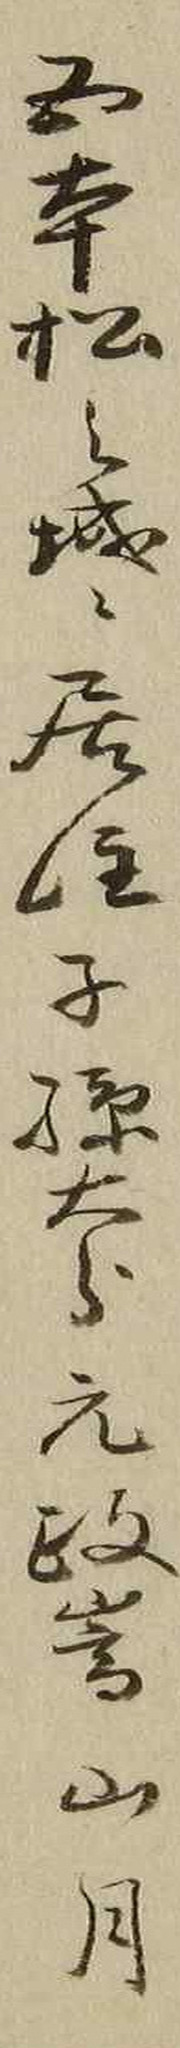五本松之城に居住子孫太郎元政嵩山月
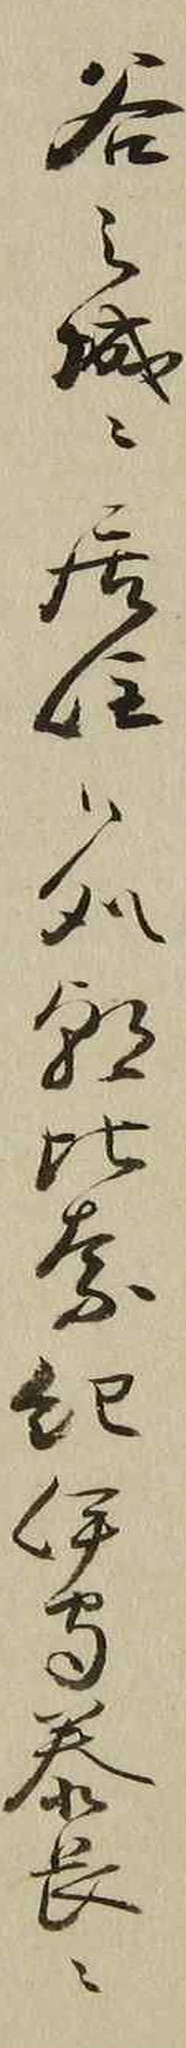谷之城に居住候処朝比奈紀伊守泰長に
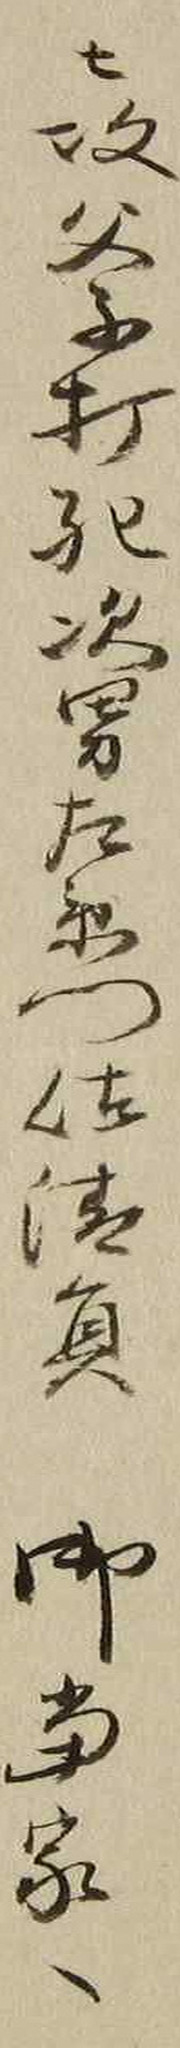被攻父子討死次男左衛門佐清員御当家へ
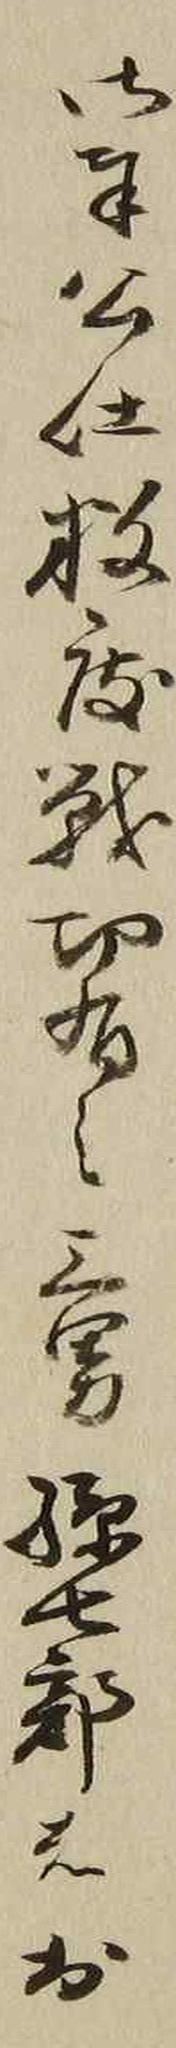御奉公仕数度戦功有之三男孫七郎は於
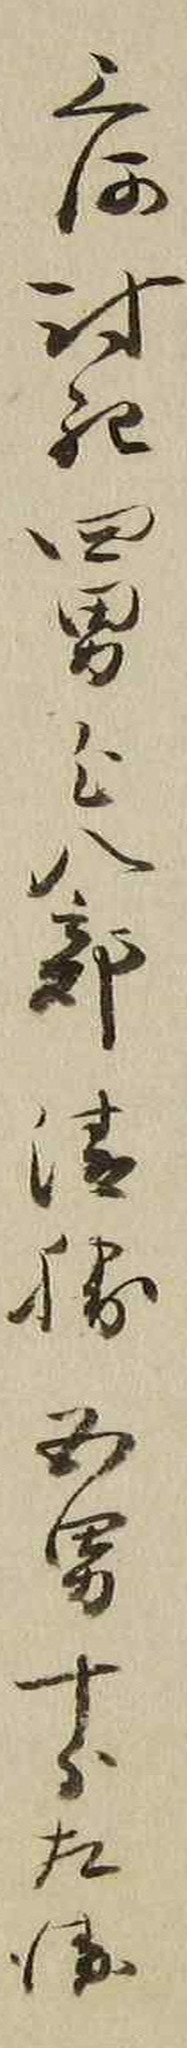三河討死四男与八郎清勝五男十郎左衛
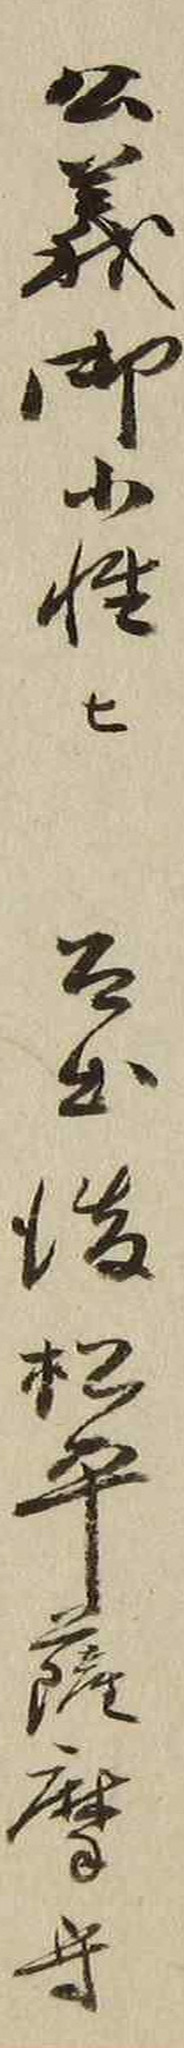公儀御小姓被召出後松平薩摩守
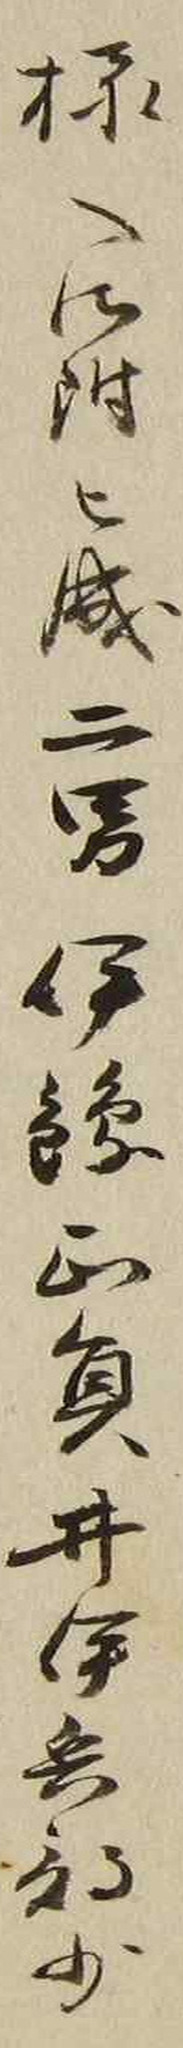様へ御附被成二男伊豫正員井伊兵部少
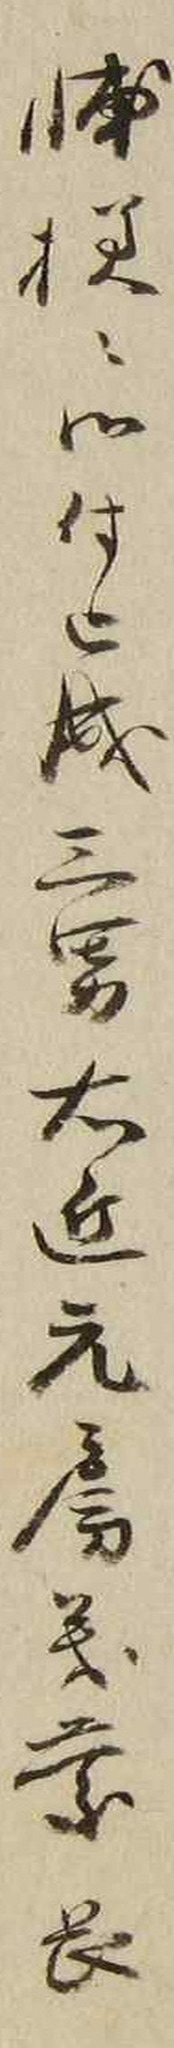輔様に御仕被成三男右近元房義慶長
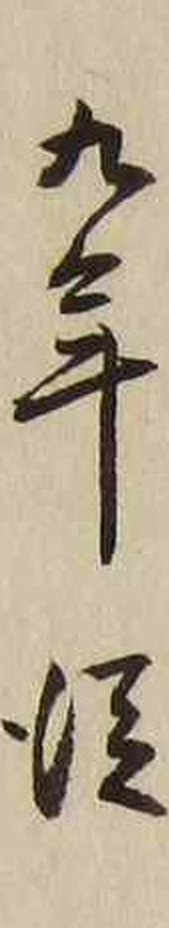九年従
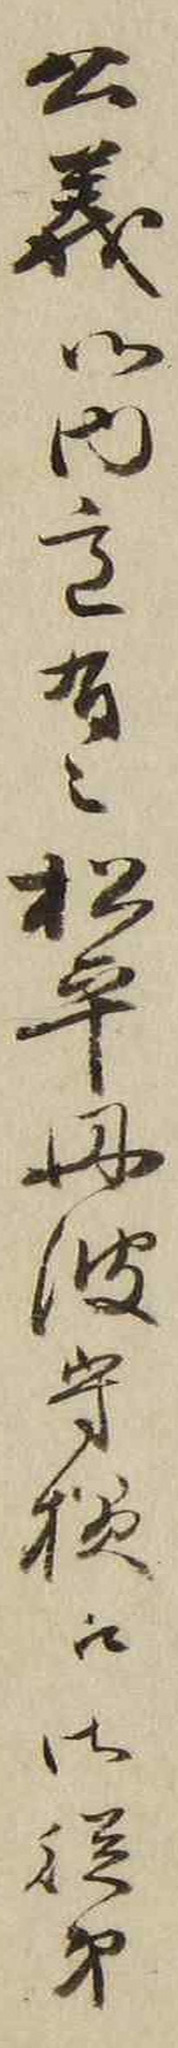公儀御内意有之松平丹波守様江御従弟

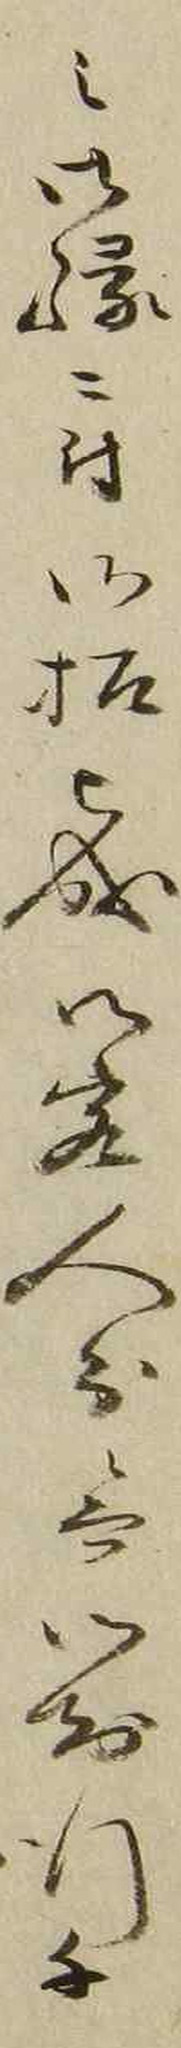之御縁に付御招被成御客人分に而御知行千
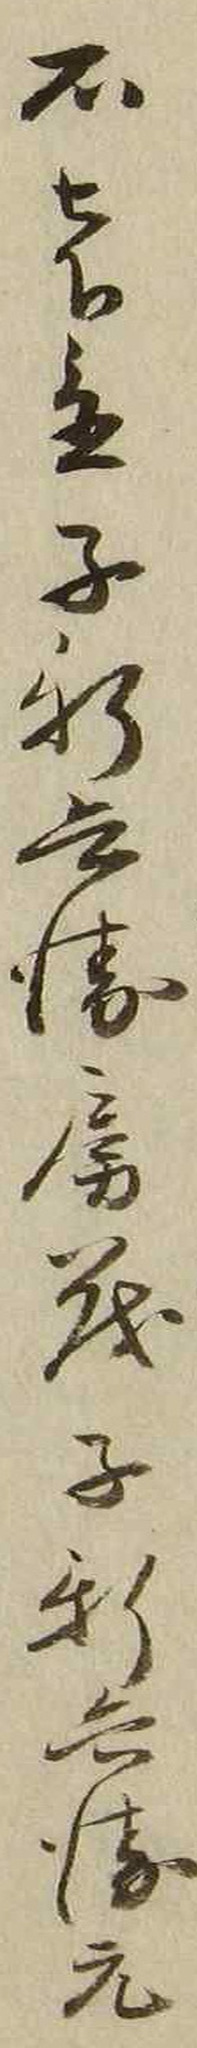石被下置子新兵衛房茂子新兵衛元
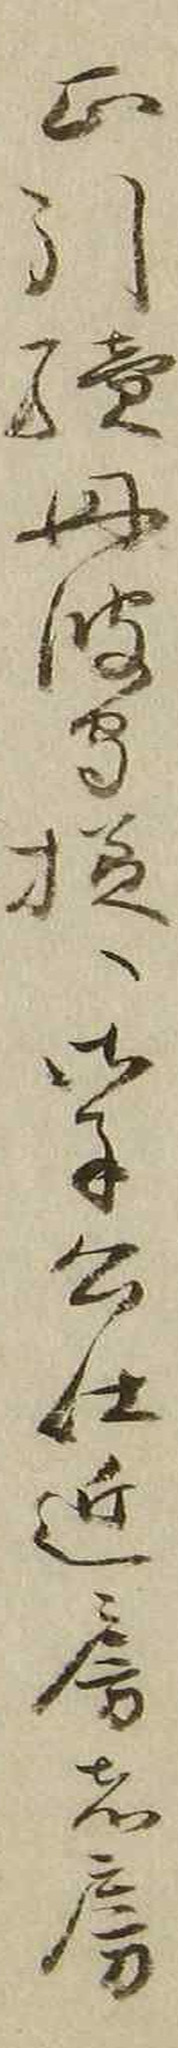正引続丹波守様へ御奉公仕近房は房
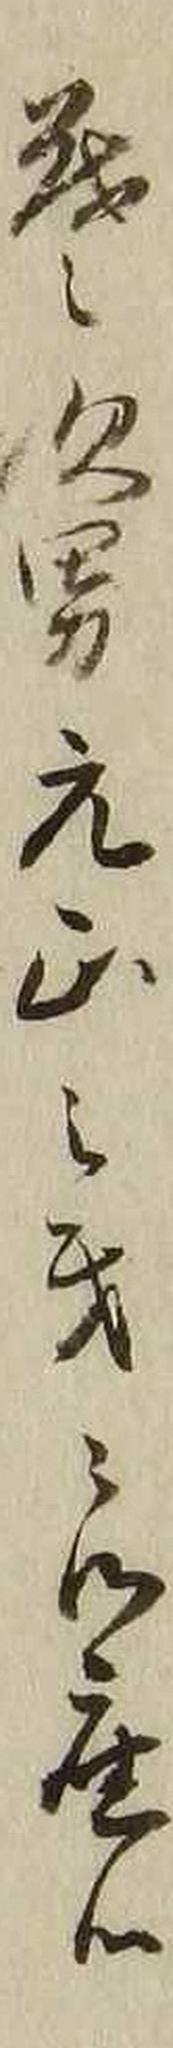茂之次男元正之弟に御座候
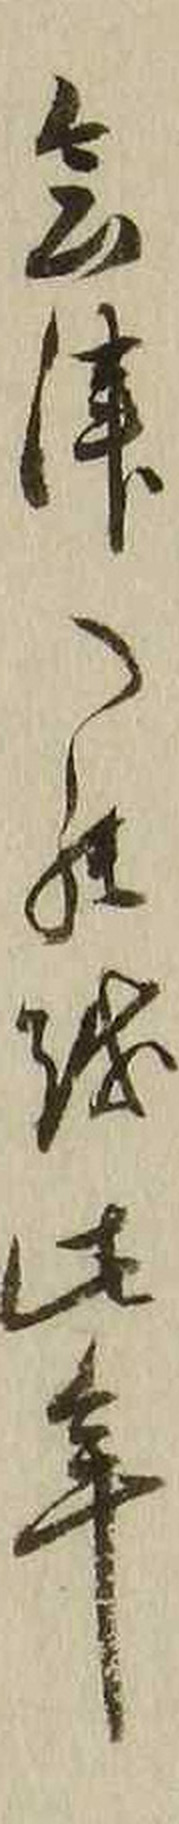会津へ罷越此年
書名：諸士系譜　巻之269　さ之部1
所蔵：会津若松市立会津図書館
